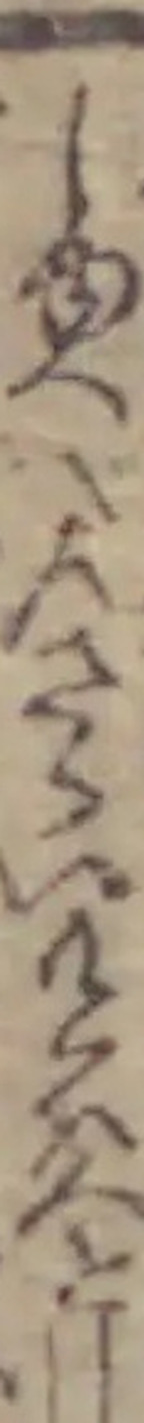しゆへべんさらいもとは人を
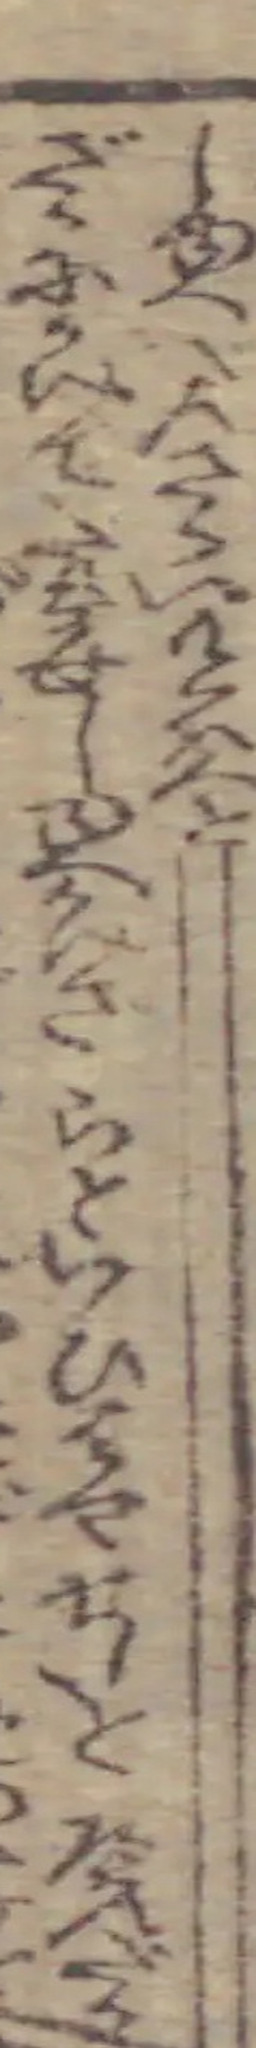ざらにかけてたませしゆへかけざらといひはやせしをへんざら
